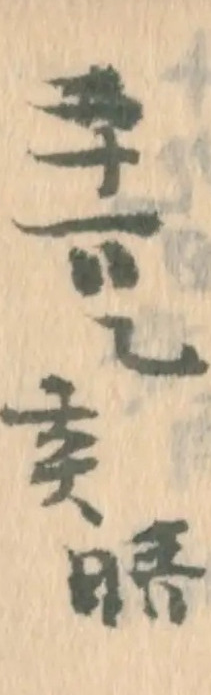二十一日乙亥晴
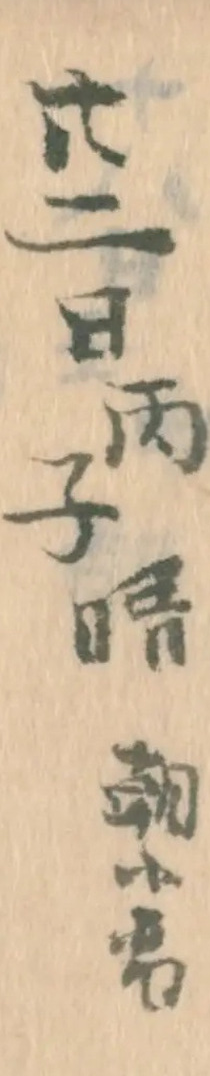廿二日丙子晴朝小雪
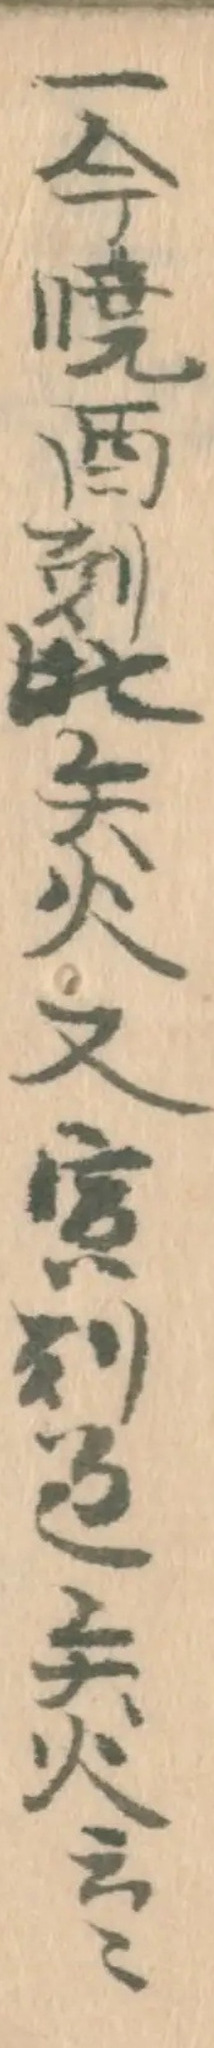一今晩酉刻頃失火又寅刻過失火云々
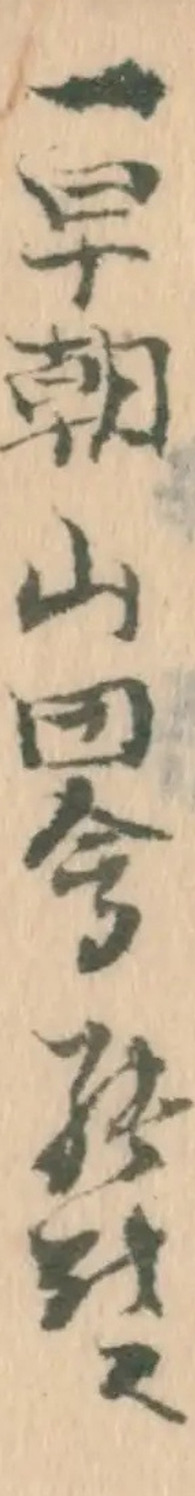一早朝山田会罷越ス
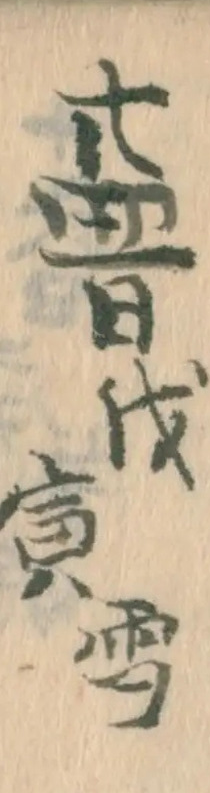廿四日戊寅雪
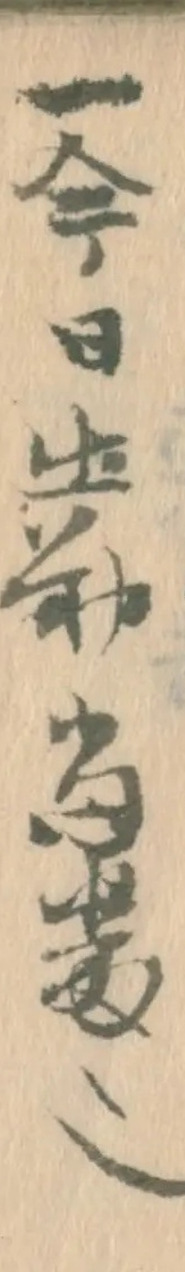一今日出勤当番也
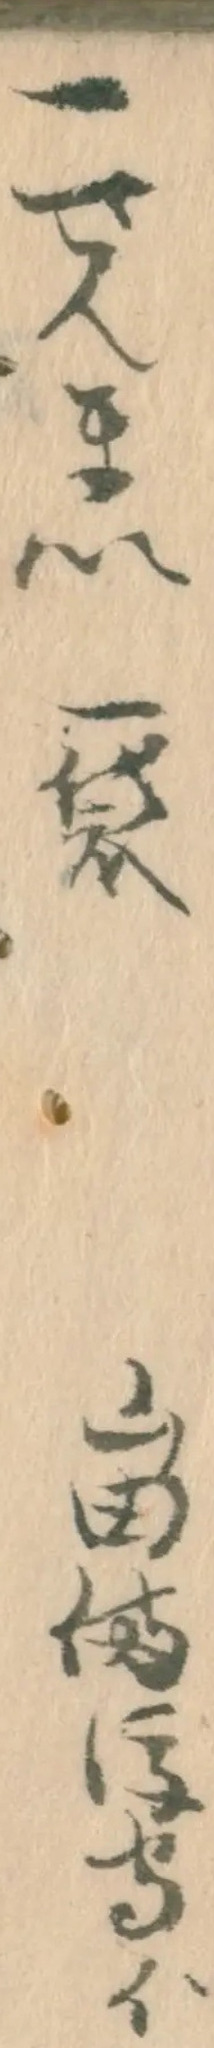一せんまい一袋山田備後守ゟ
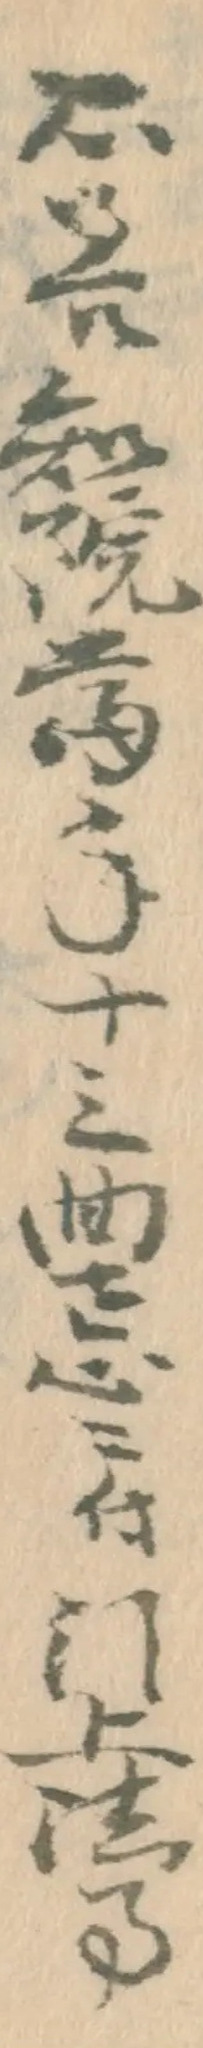右善知院当年十三回忌ニ付引上法事
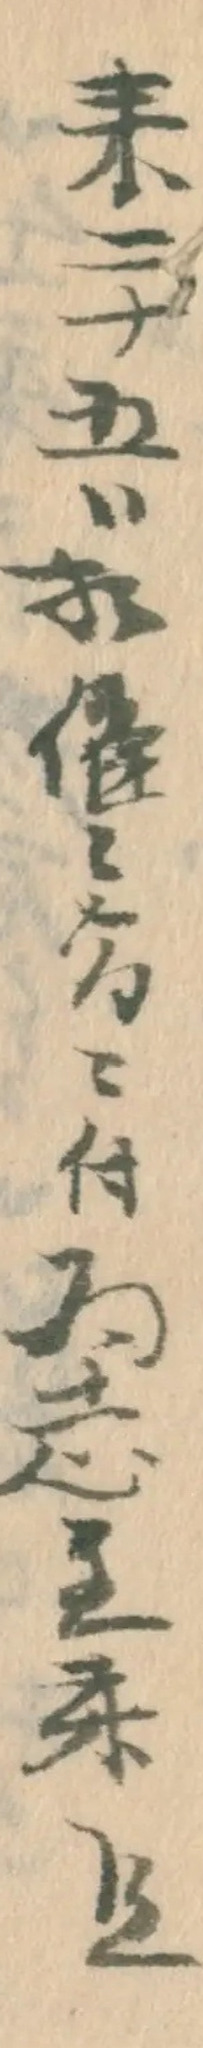来二十五日相催候旨ニ付為志到来且
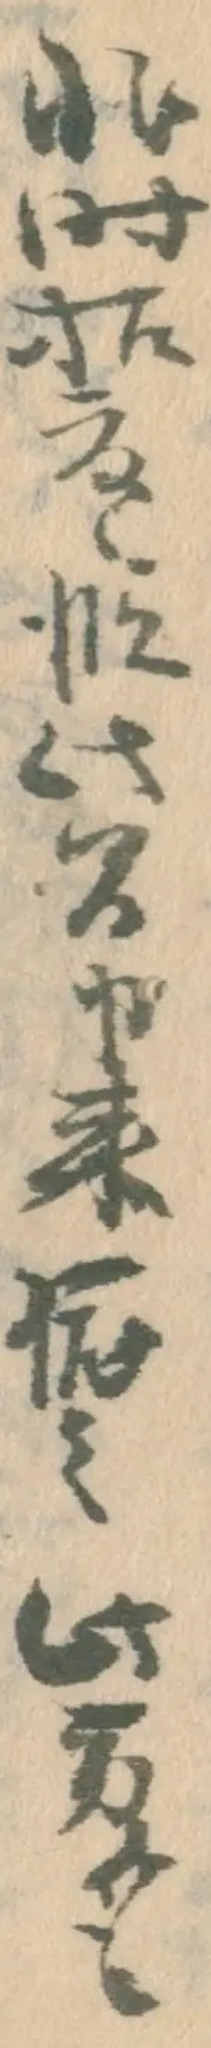非時招度之段此間申来依之此方ゟも
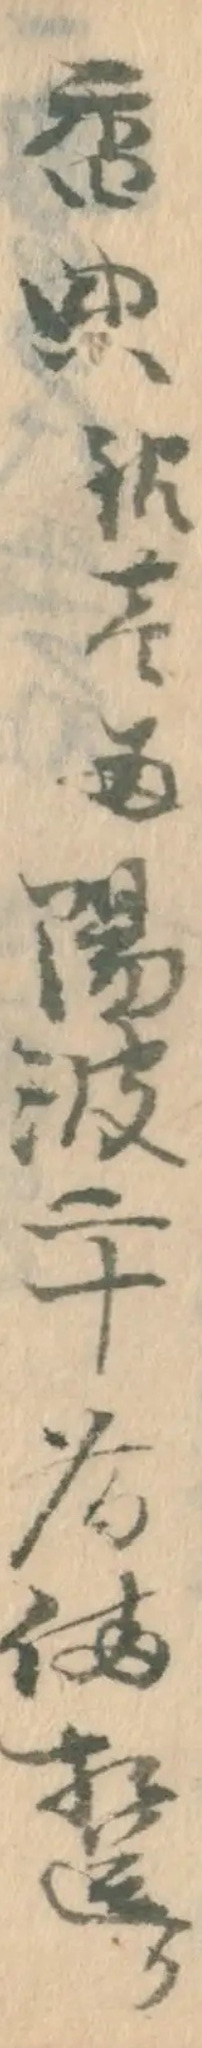香典銀壱両陽波二十為備相送り
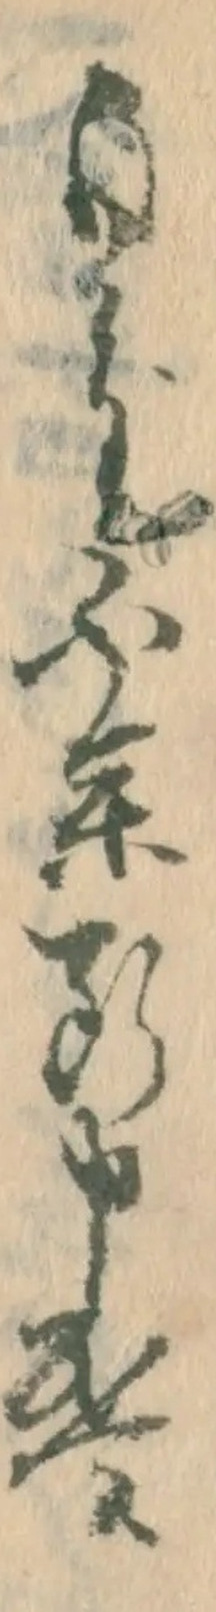自分は不参断申遣ス

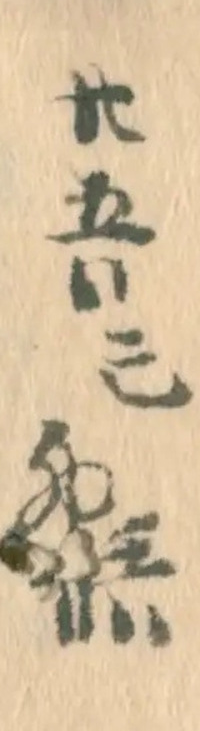廿五日己卯晴
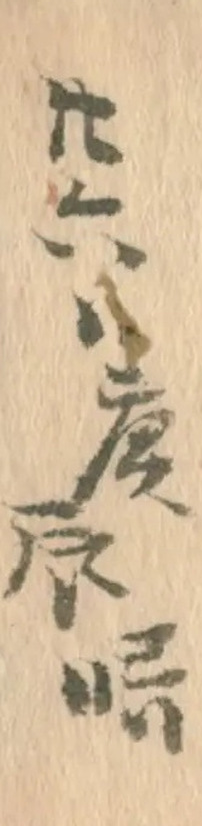廿六日庚辰晴
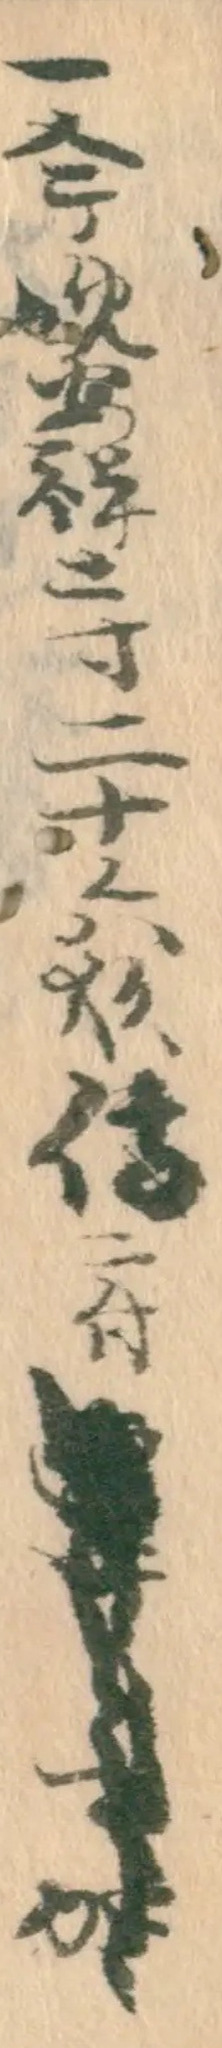一今晩安禅寺二十六夜待ニ付
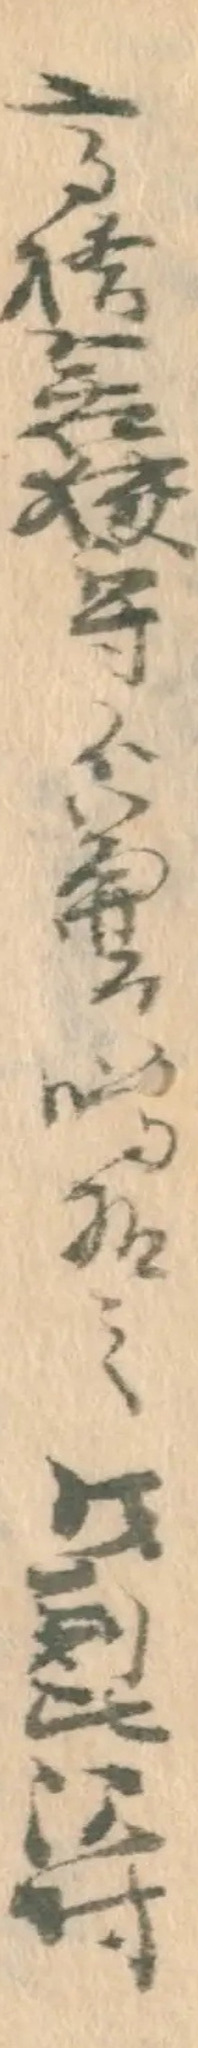高橋若狭守ゟ兼而噂有之戌刻頃沢村
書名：禁裏御所御用日記. [131]
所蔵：国立国会図書館 National Diet Library, JAPAN
